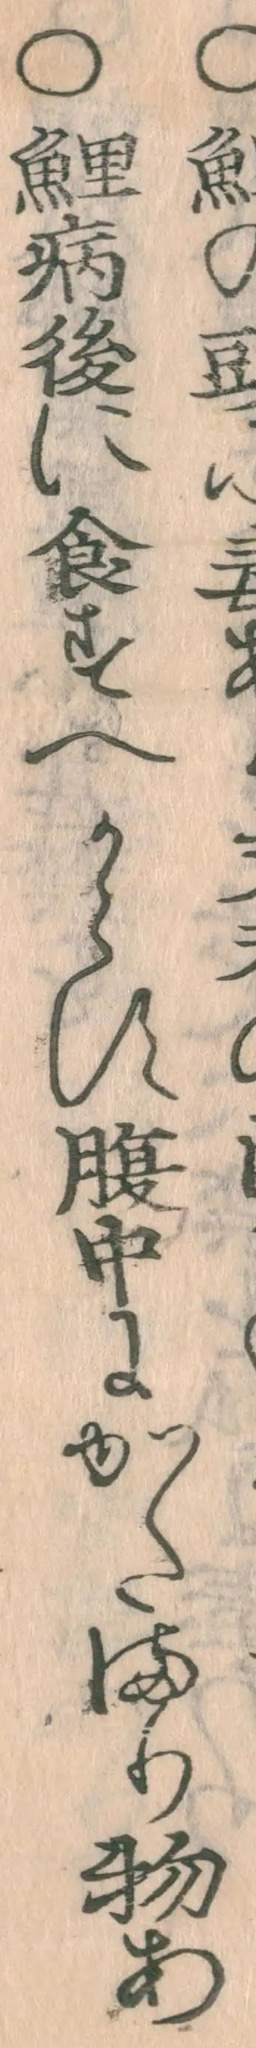〇鯉病後に食すへからす腹中にかたまり物あ
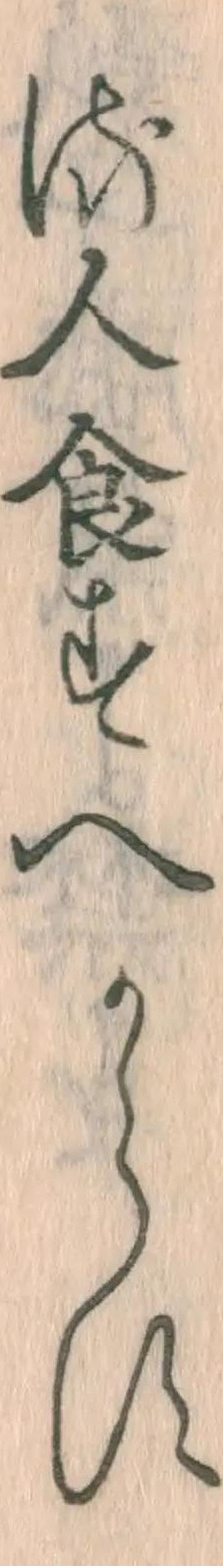る人食すへからす
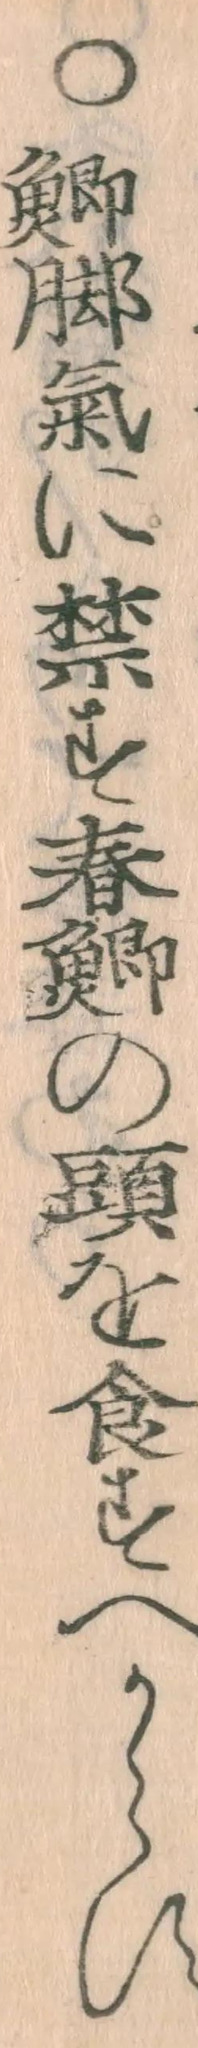〇鯽脚気に禁す春鯽の頭を食すへからす
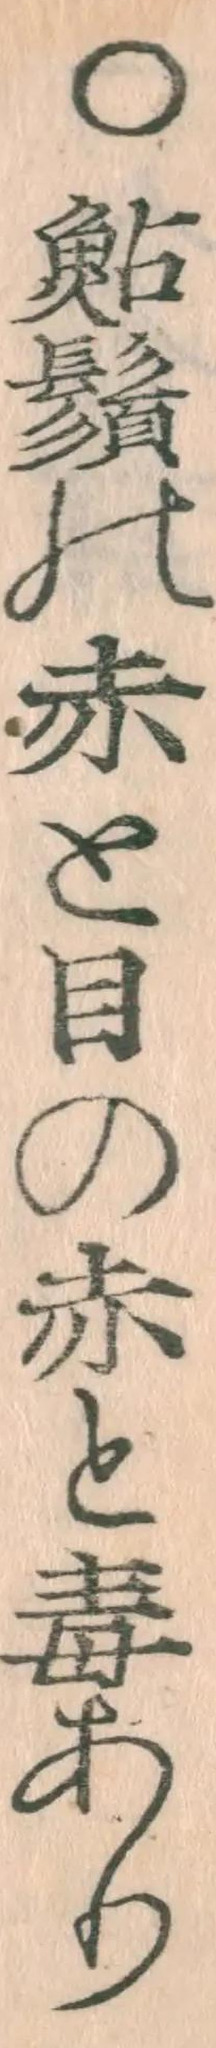〇鮎鬚の赤と目の赤と毒あり
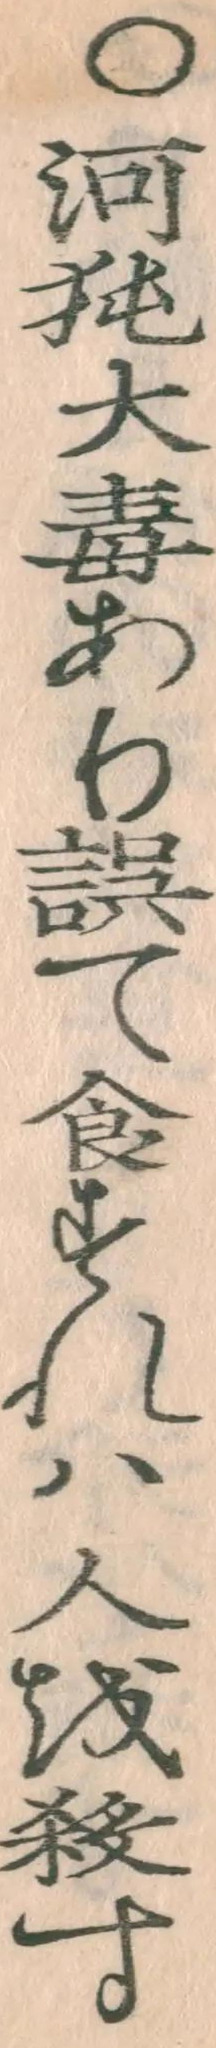〇河㹠大毒あり誤て食すれは人を殺す
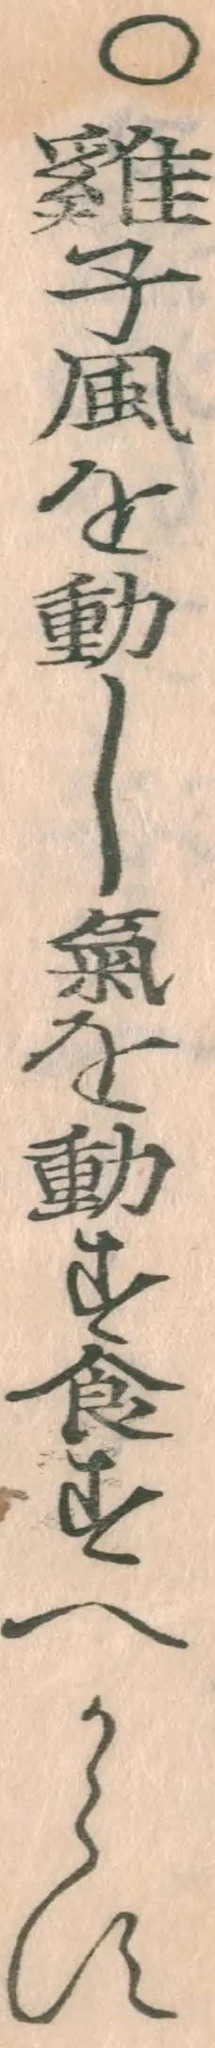〇鷄子風を動し気を動す食すへからす
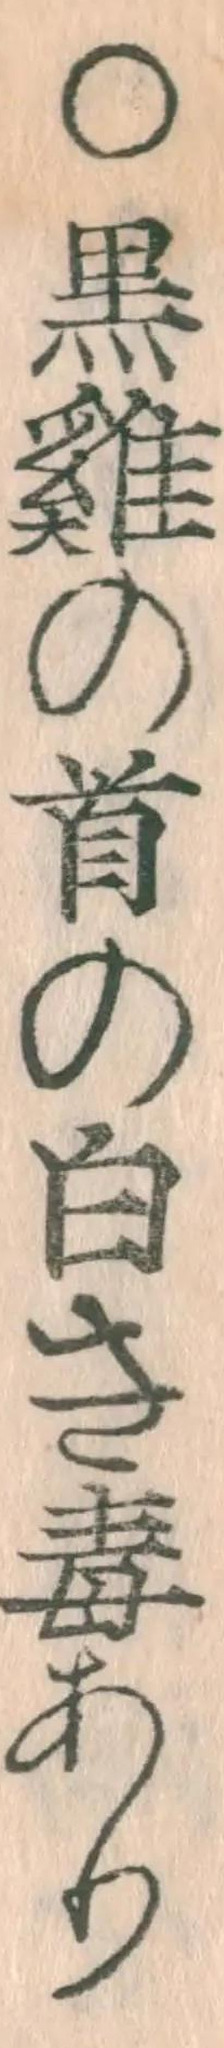〇黒鶏の首の白き毒あり
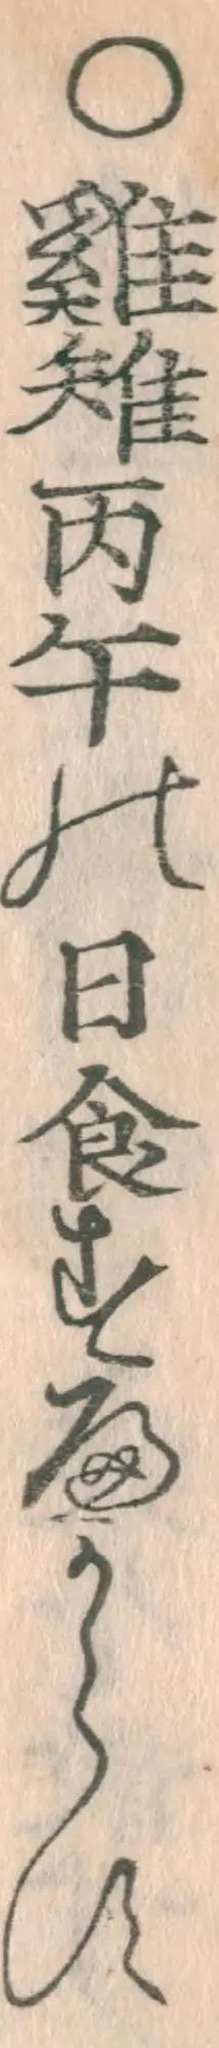〇鷄雉丙午の日食すへからす
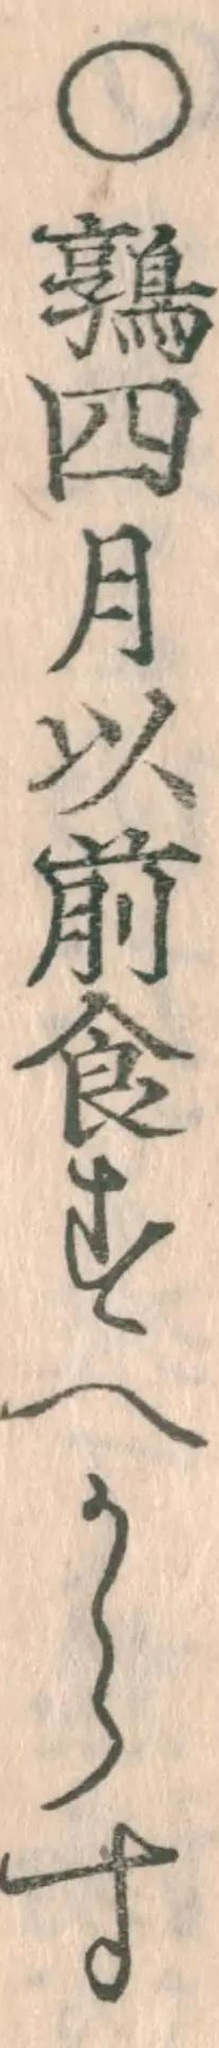〇鶉四月以前食すへからす
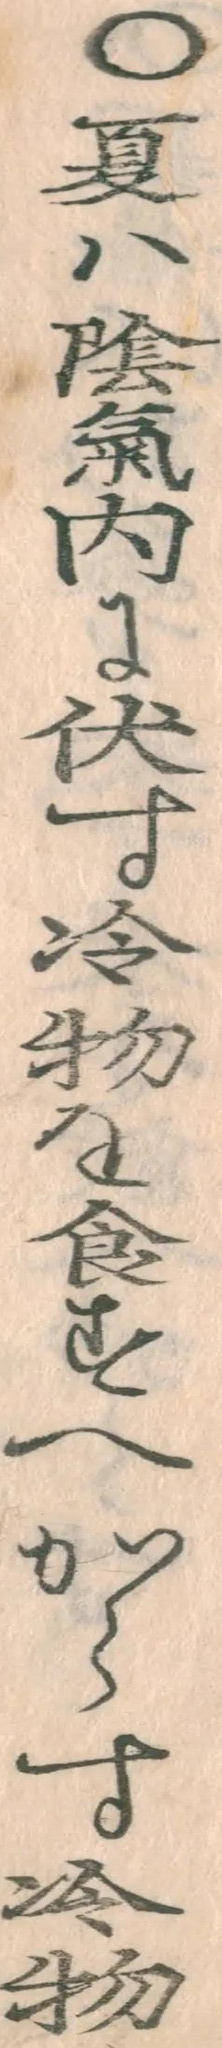〇夏は陰気内に伏す冷物を食すへからす冷物
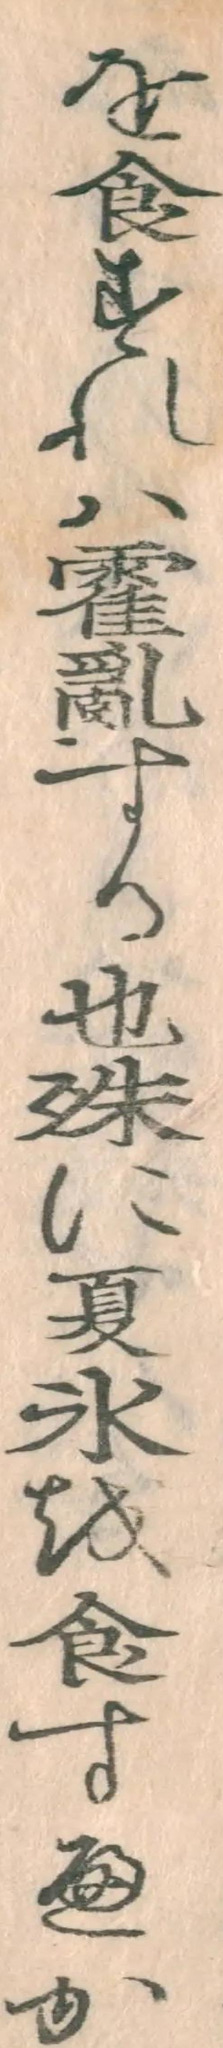を食すれは霍乱する也殊に夏氷を食すへか

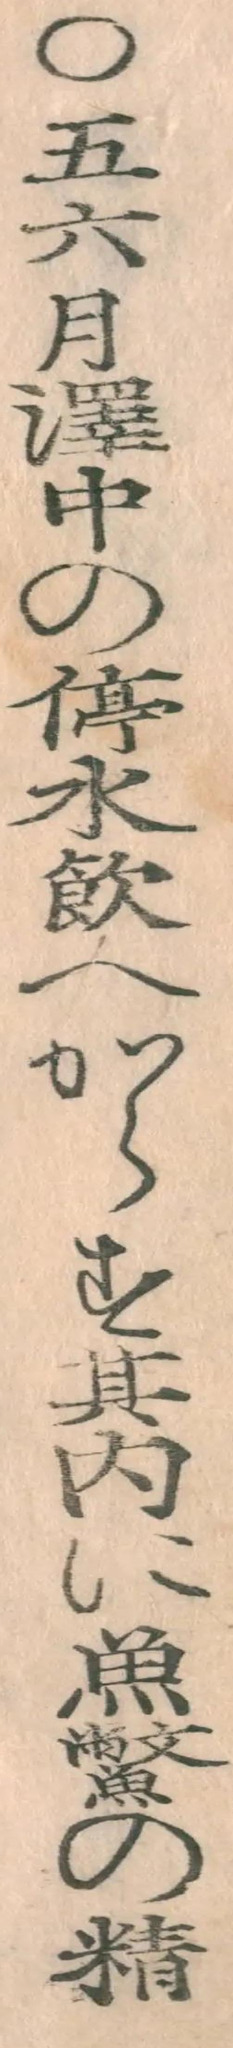〇五六月沢中の停水飲へからす其内に魚鼈の精
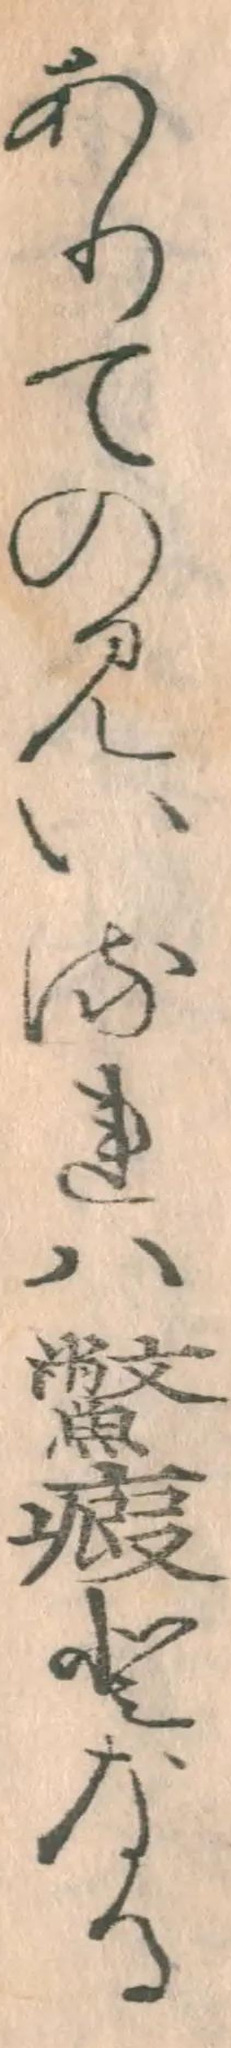ありてのみいるれは鼈瘕となる
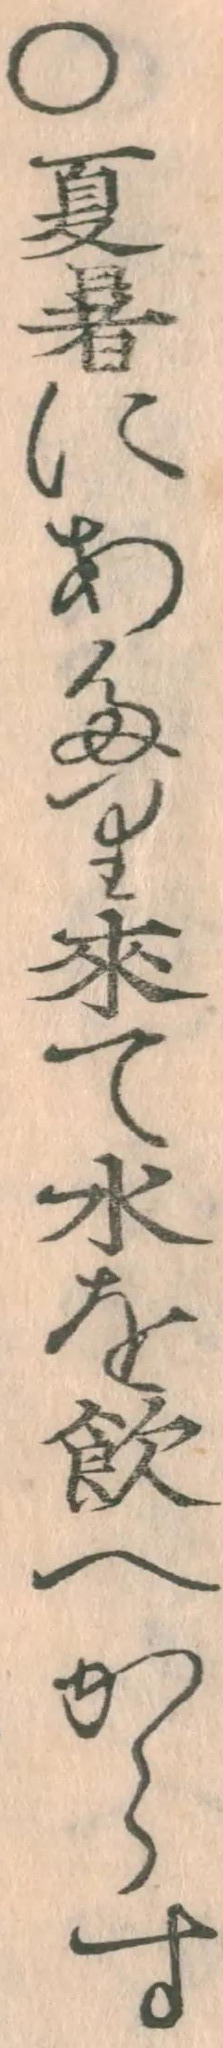〇夏暑にあたり来て水を飲へからす
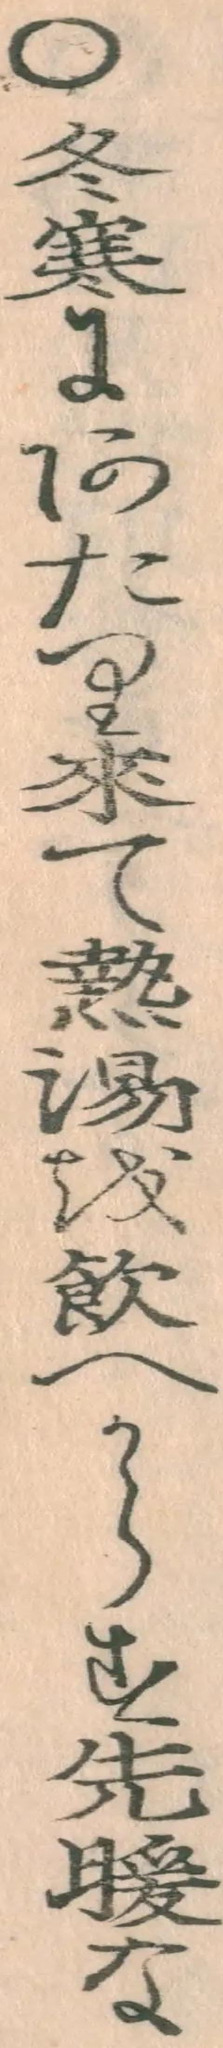〇冬寒にあたり来て熱湯を飲へからす先暖な
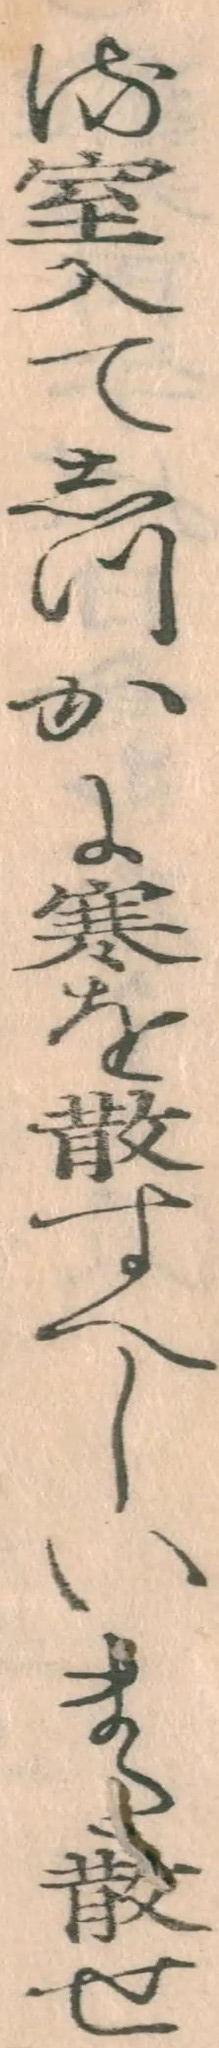る室入てしつかに寒を散すへしいまた散せ
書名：延壽撮要
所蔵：国立国会図書館 National Diet Library, JAPAN
